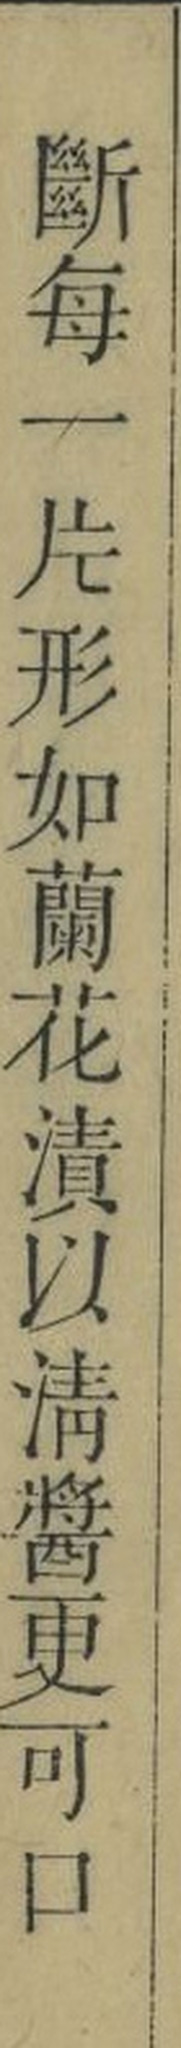断毎一片形如蘭花漬以清醬更可口
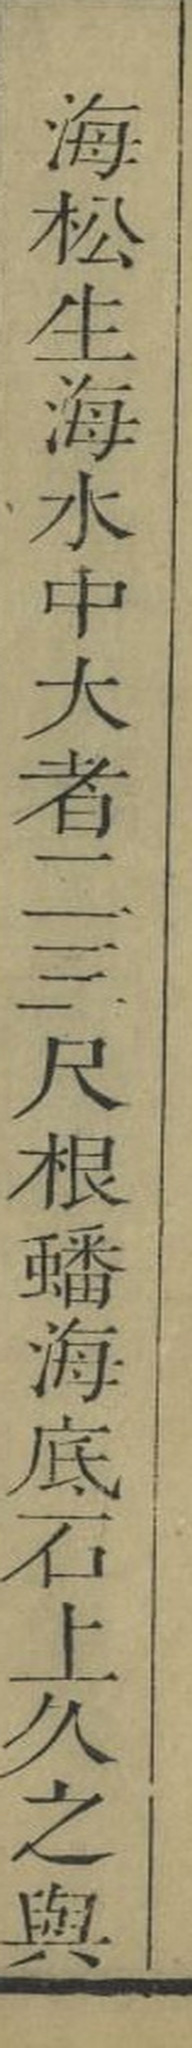海松生海水中大者二三尺根蟠海底石上久之与
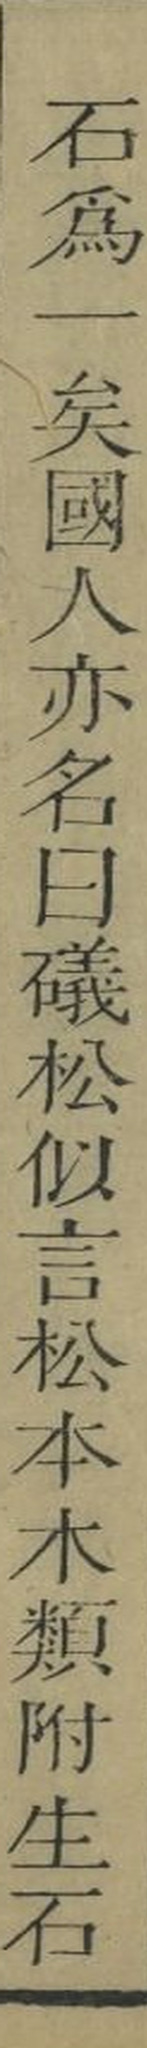石為一矣国人亦名曰礒松似言松本木類附生石
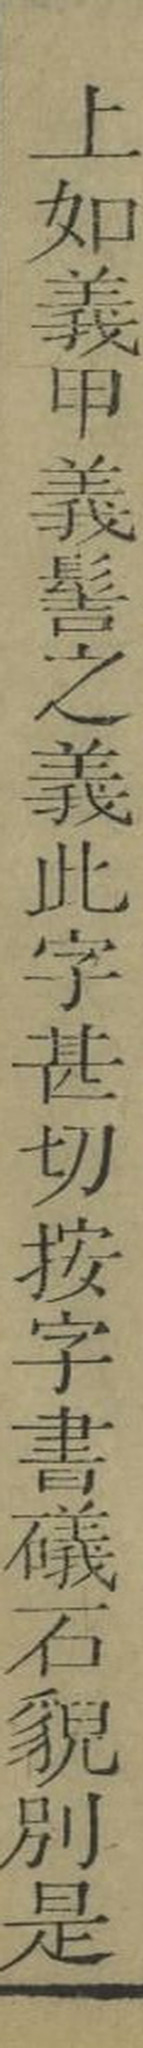上如義甲義髻之義此字甚切按字書礒石貌別是
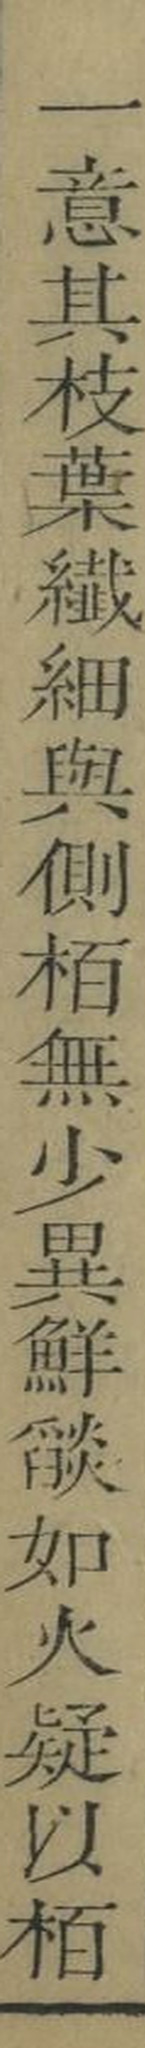一意其枝葉繊細与側栢無少異鮮燄如火疑以栢

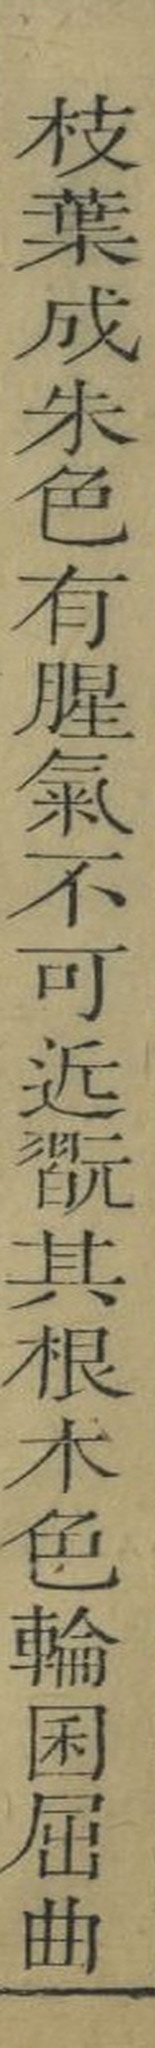枝葉成朱色有腥気不可近翫其根木色輪囷屈曲
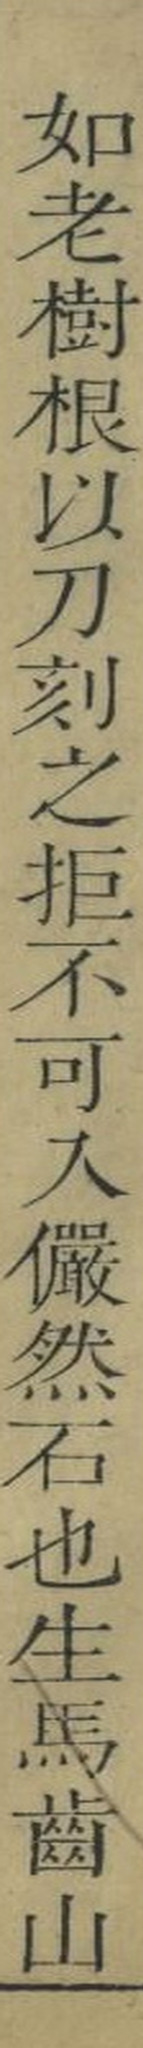如老樹根以刀刻之拒不可入儼然石也生馬歯山
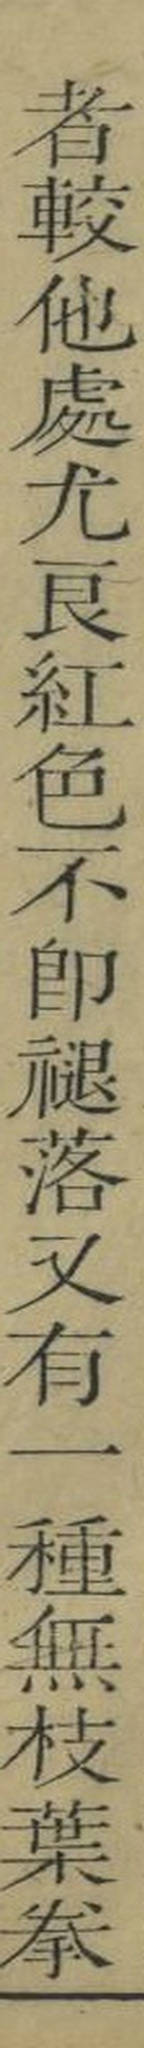者較他処尤良紅色不即褪落又有一種無枝葉拳
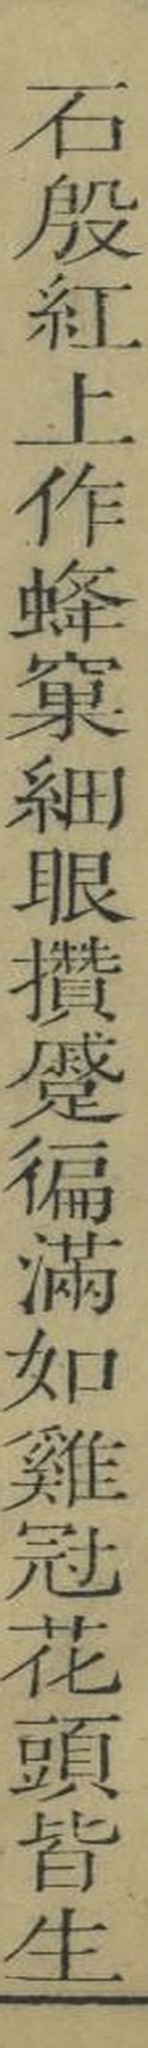石殷紅上作蜂窠細眼攢蹙徧満如鶏冠花頭皆生
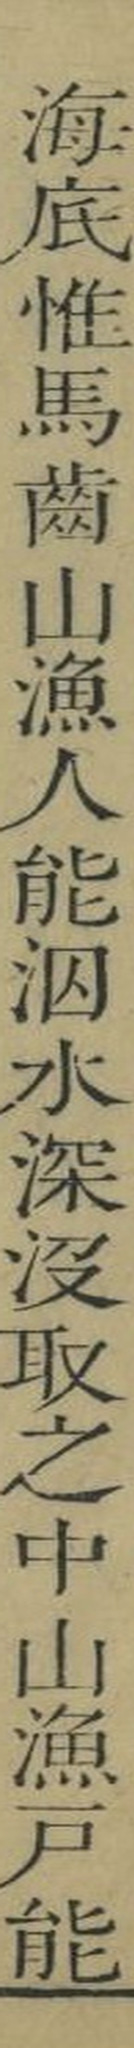海底惟馬歯山漁人能泅水深没取之中山漁戸能
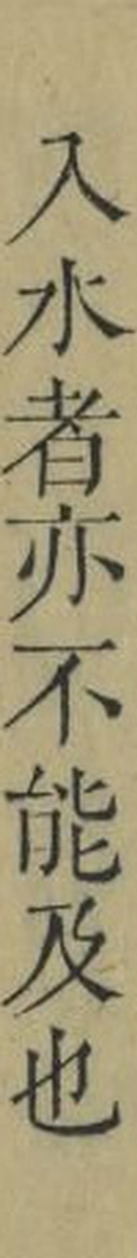入水者亦不能及也
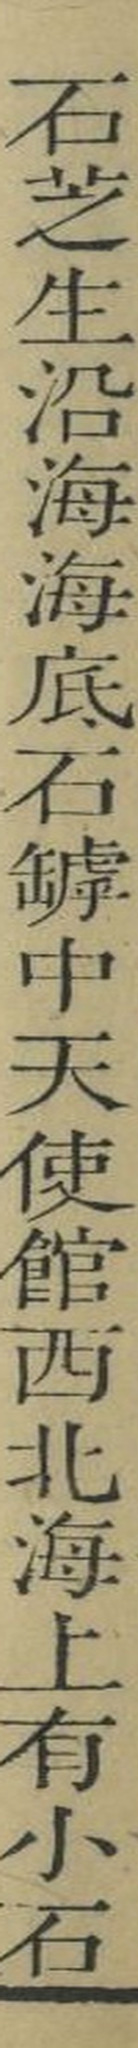石芝生沿海海底石罅中天使館西北海上有小石
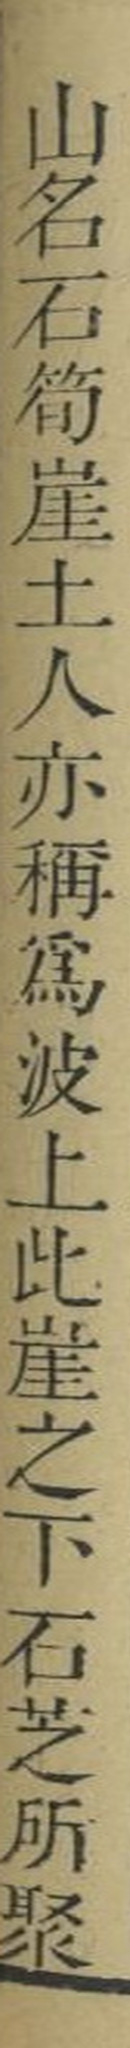山名石筍崖土人亦称為波上此崖之下石芝所聚
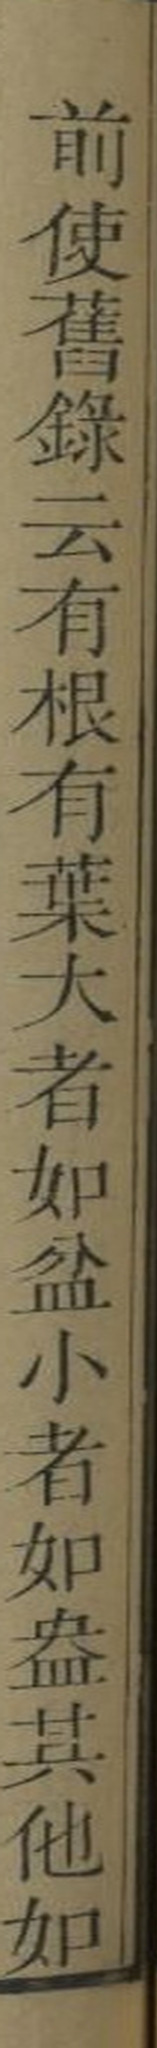前使旧録云有根有葉大者如盆小者如盎其他如
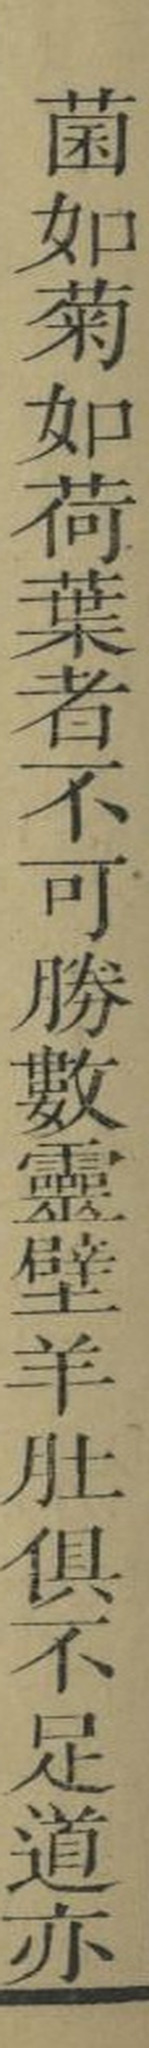菌如菊如荷葉者不可勝数霊壁羊肚俱不足道亦
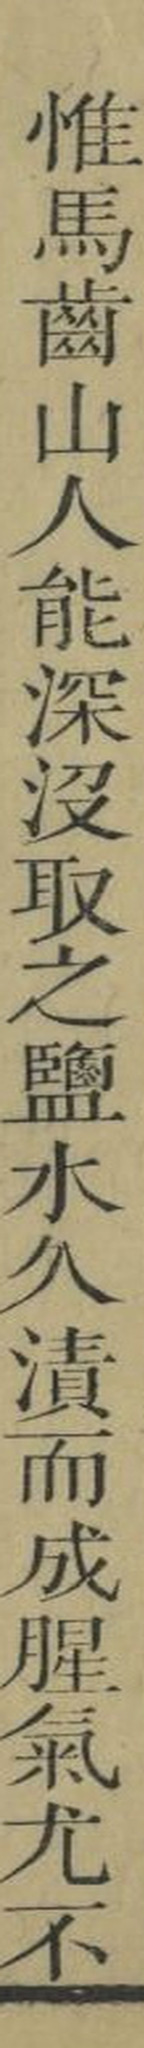惟馬歯山人能深没取之塩水久漬而成腥気尤不
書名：中山伝信録 巻六
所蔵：University of the Ryukyus Library
